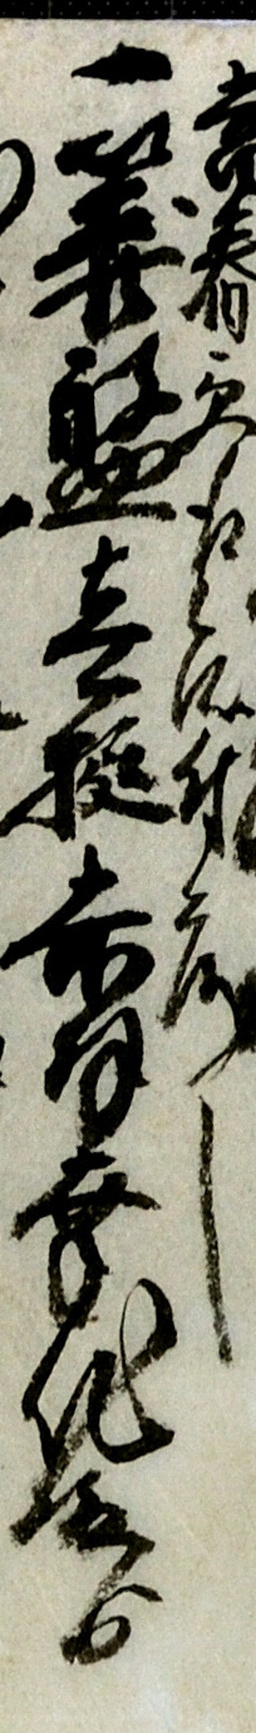一算盤壱挺赤羽幸作殿ゟ
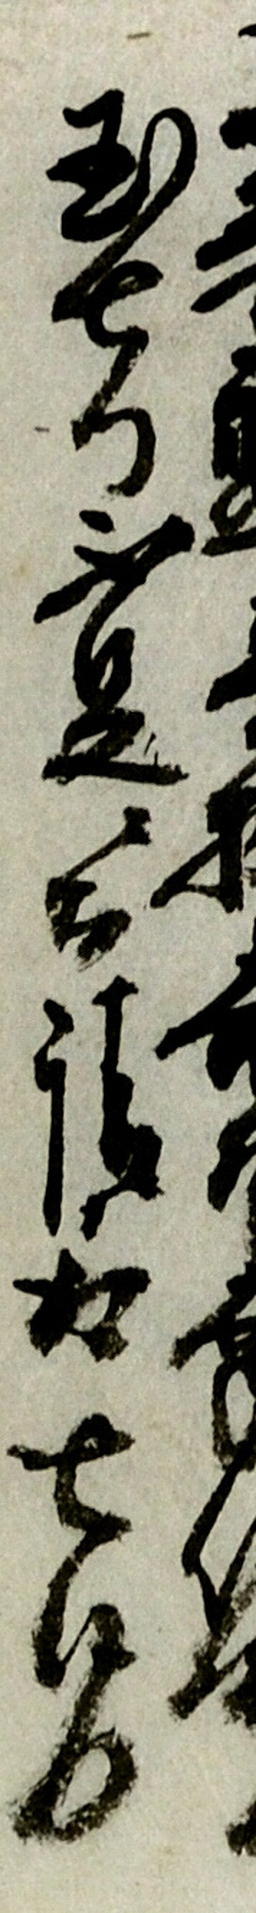玉七つ不足に而請取七左衛門
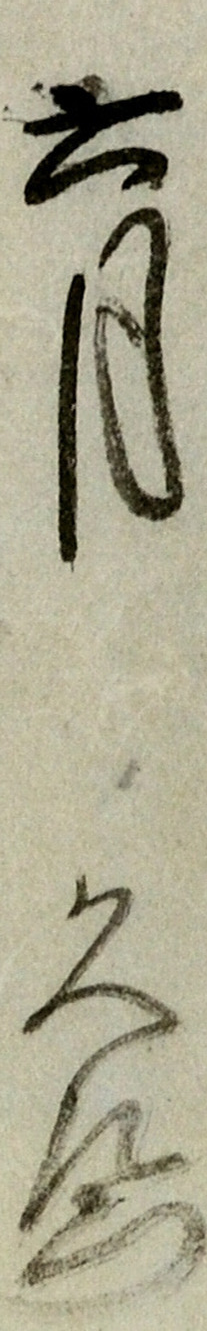六月久左衛門
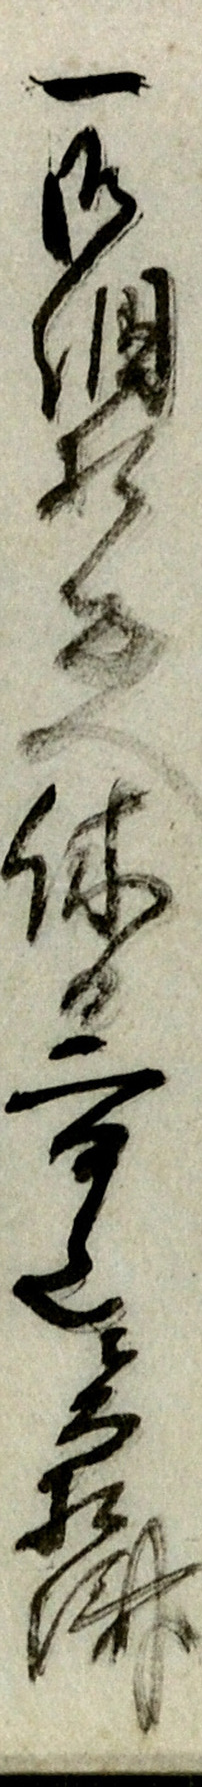一御網打両人休日二日迄にて相済
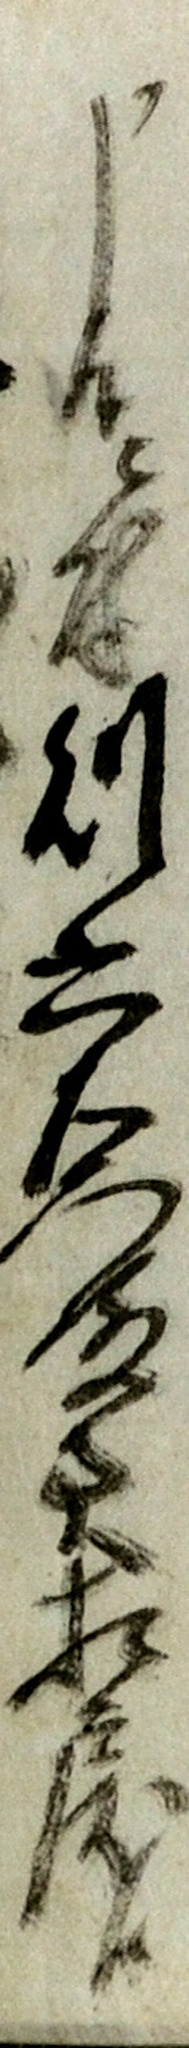申候に付則六右衛門殿は相戻候

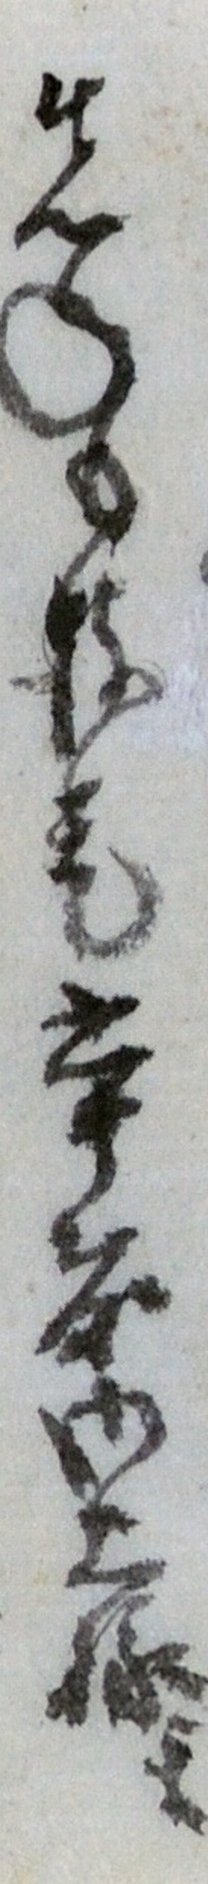先年も彼是六ヶ敷御上様にて
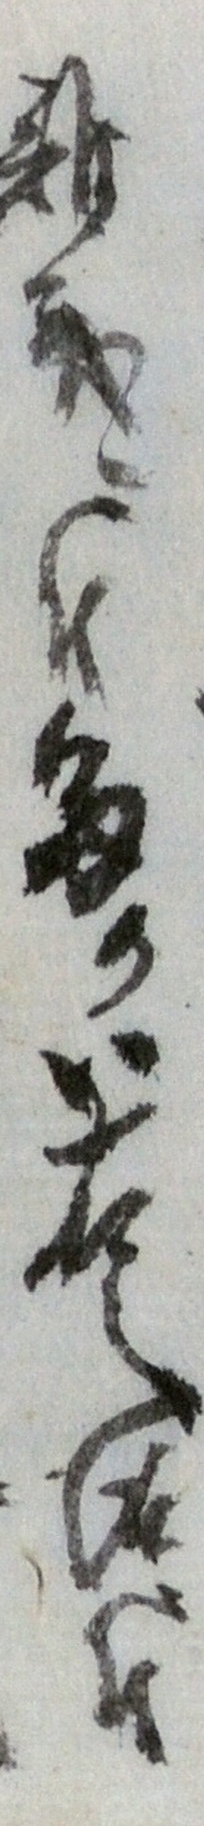難義ニ付多くハ右之趣ニ付
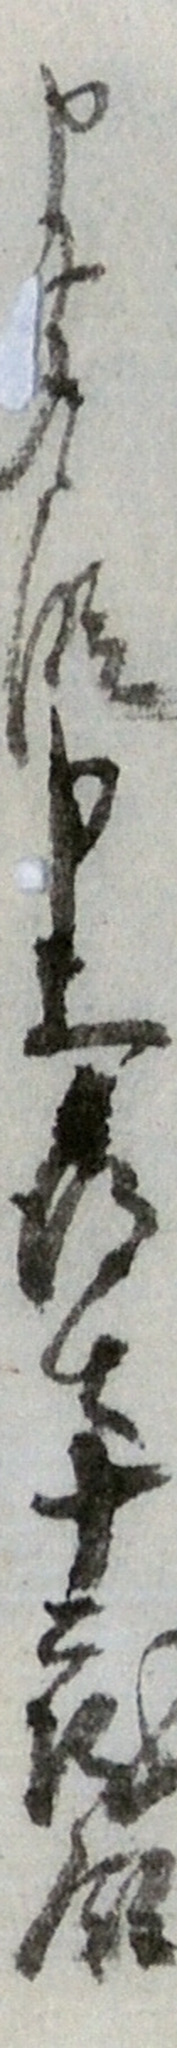申聞候段申上候得は十蔵殿
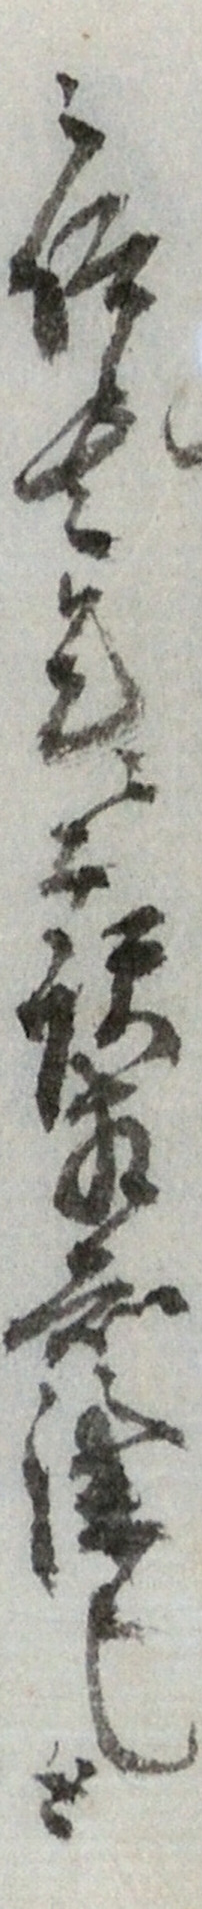被仰候は是ニ而訳相知之済申候と
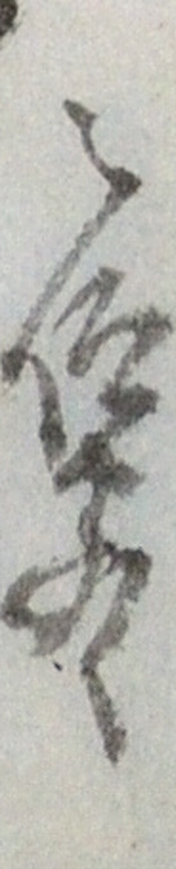被仰聞候
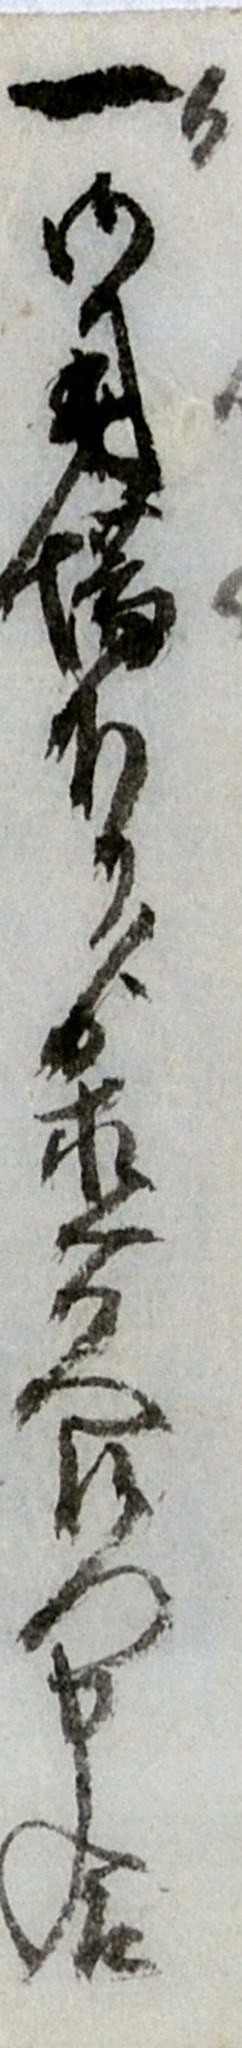一御用場下りゟ直久左衛門申合
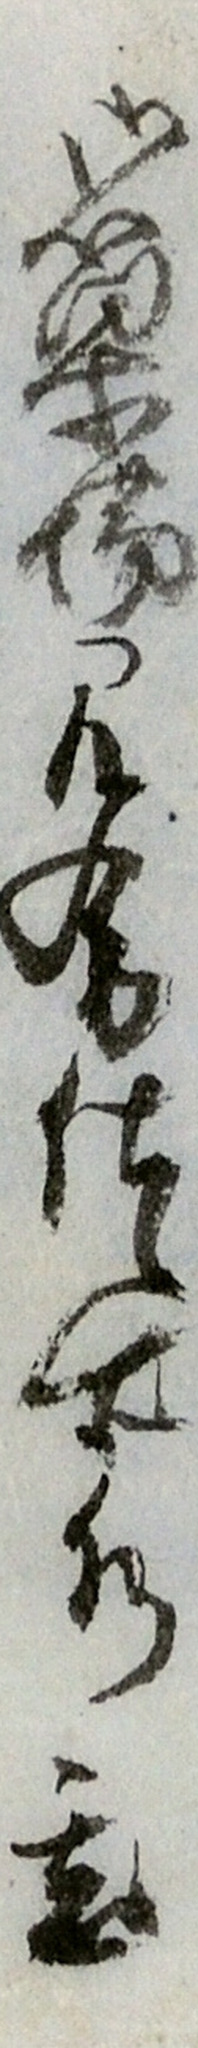御簗場見分仕候所水甚
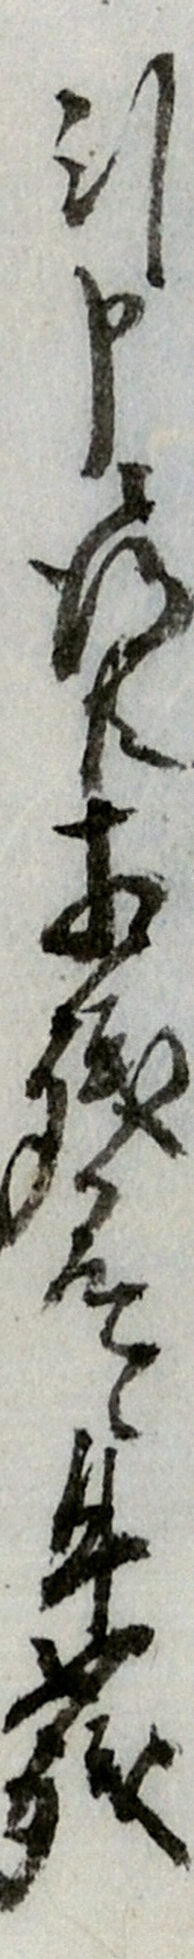引申候得共相残見候牛不残
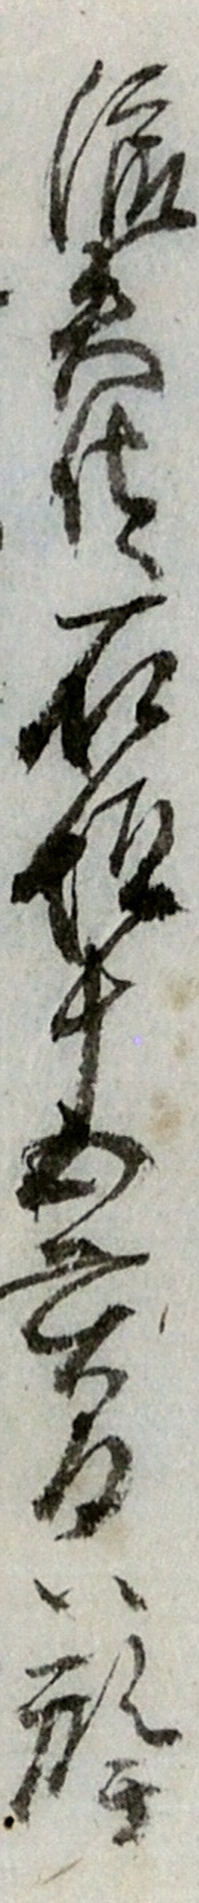流失仕候石垣十五六間ハ形チ
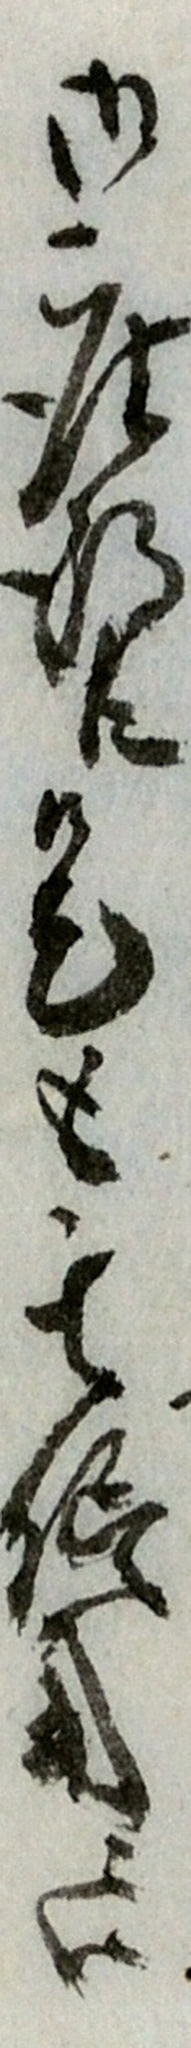御座候得共是も其侭用ニハ
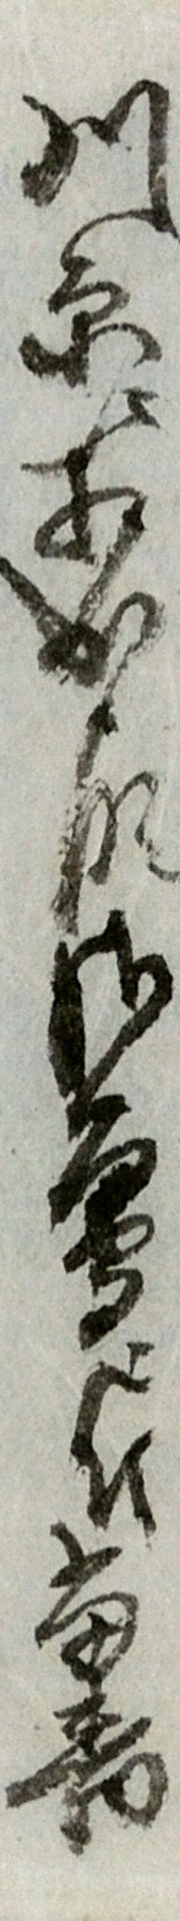川原ニ相成候段御留守に付当番
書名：分一方諸事御用留帳
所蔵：伊那市立高遠町図書館・合同会社AMANE
